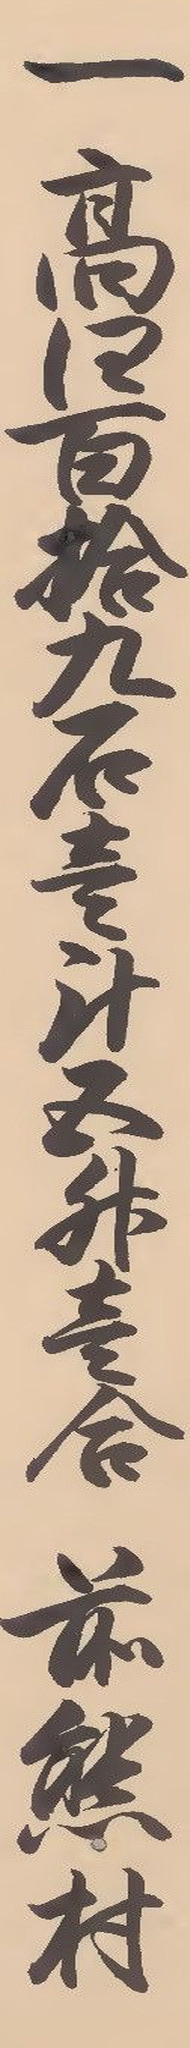一高四百拾九石壱斗五升壱合前熊村
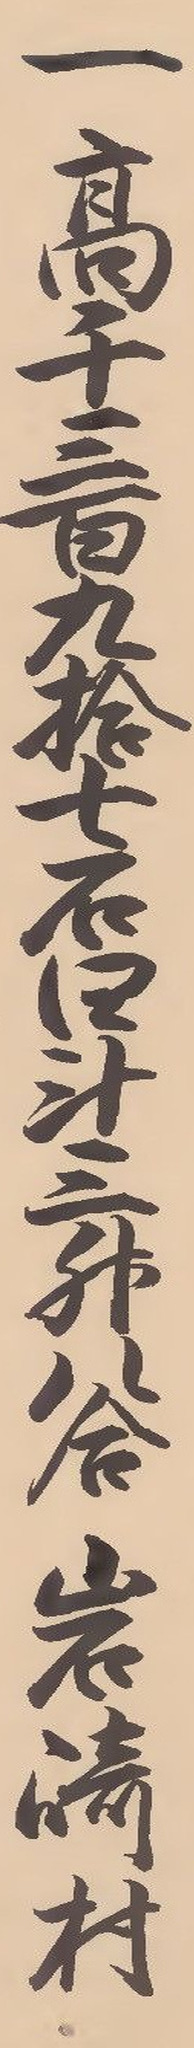一高千三百九拾七石四斗三升八合岩崎村
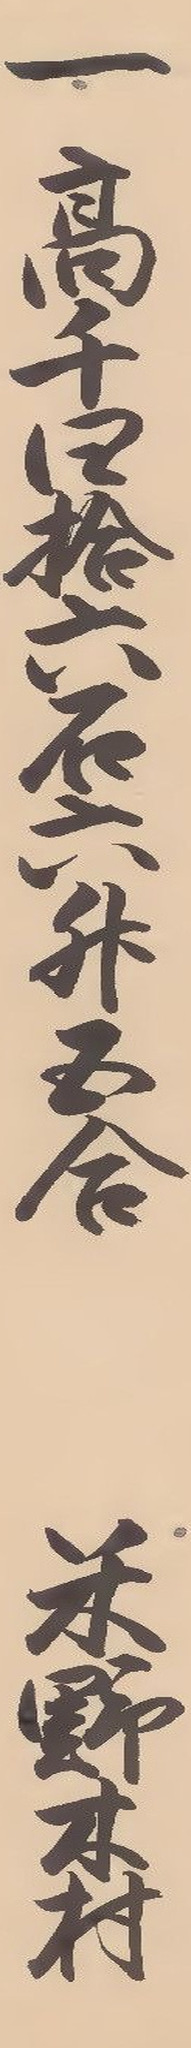一高千四拾六石六升五合米野木村

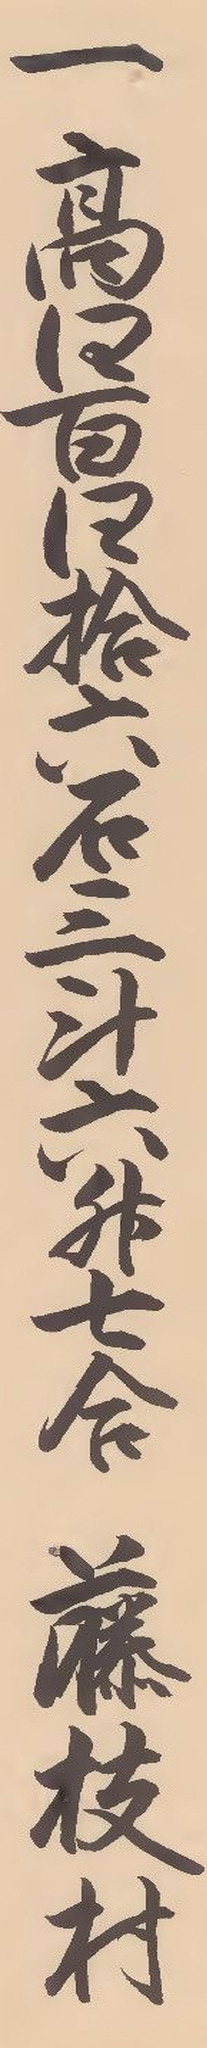一高四百四拾六石三斗六升七合藤枝村
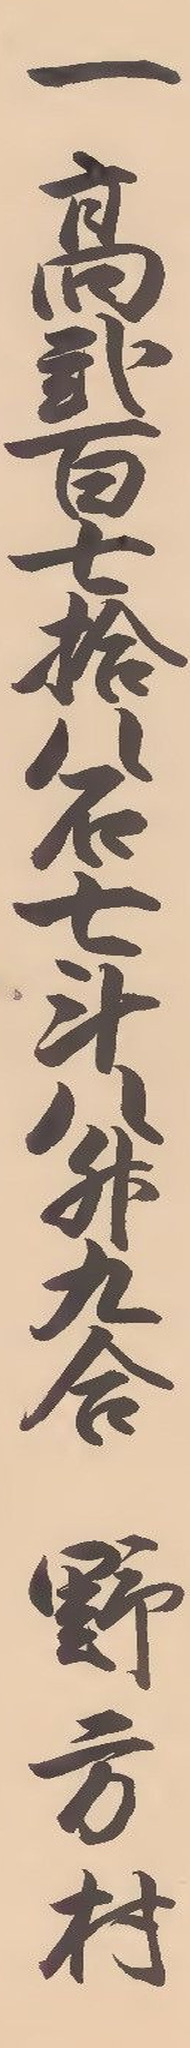一高弐百七拾八石七斗八升九合野方村
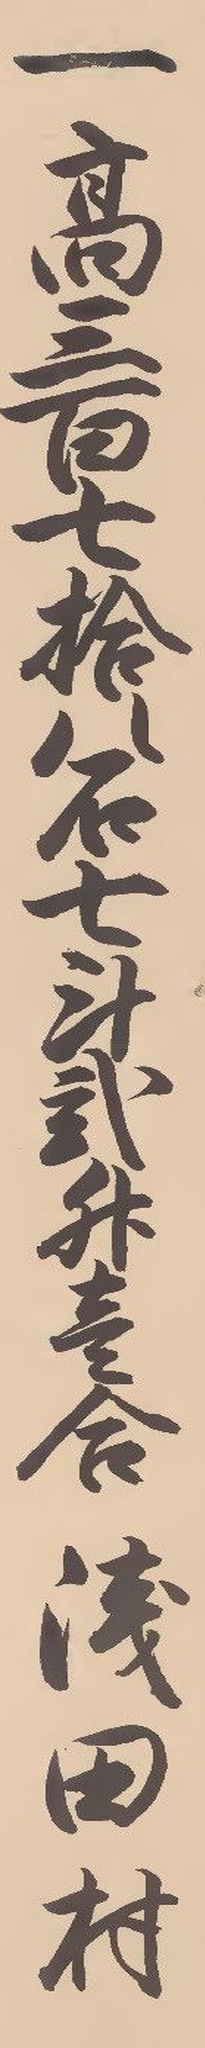一高三百七拾八石七斗弐升壱合浅田村
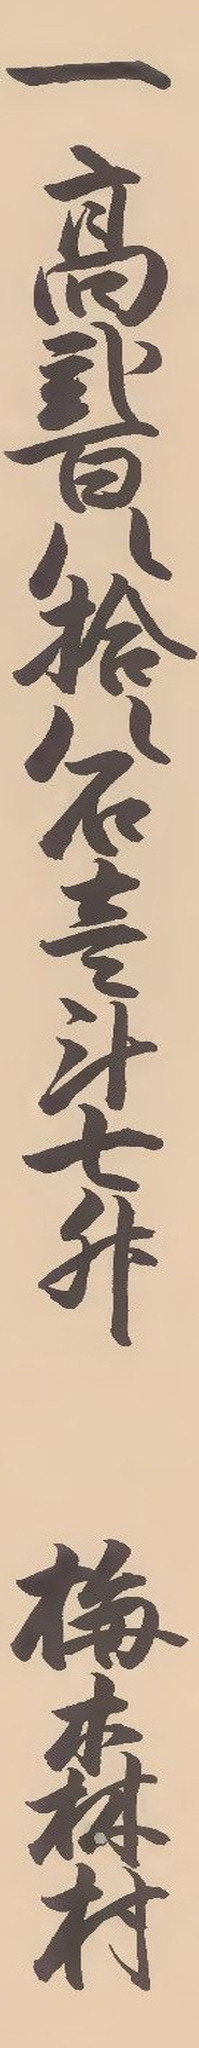一高弐百八拾八石壱斗七升梅森村
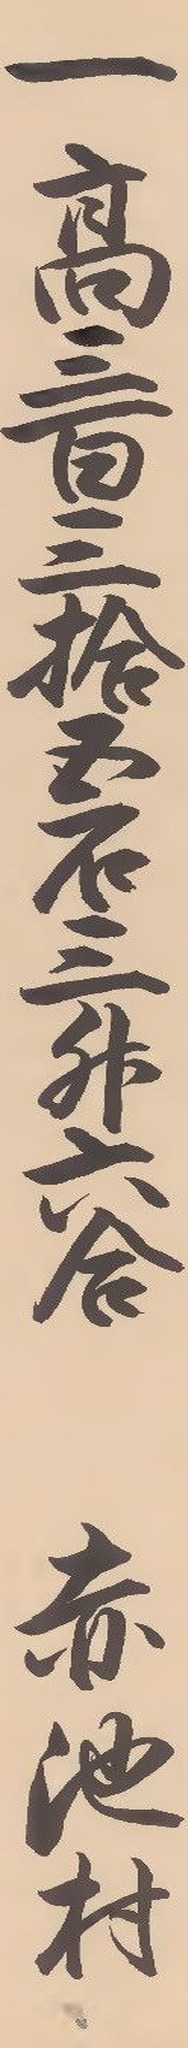一高三百三拾五石三升六合赤池村
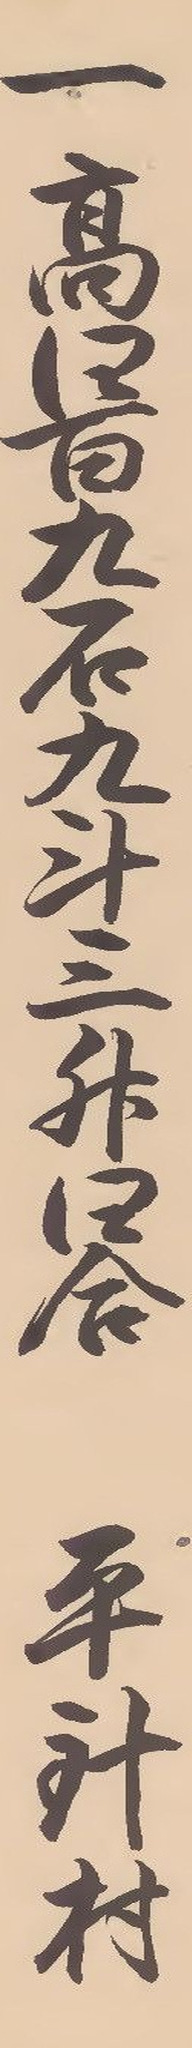一高四百九石九斗三升四合平針村

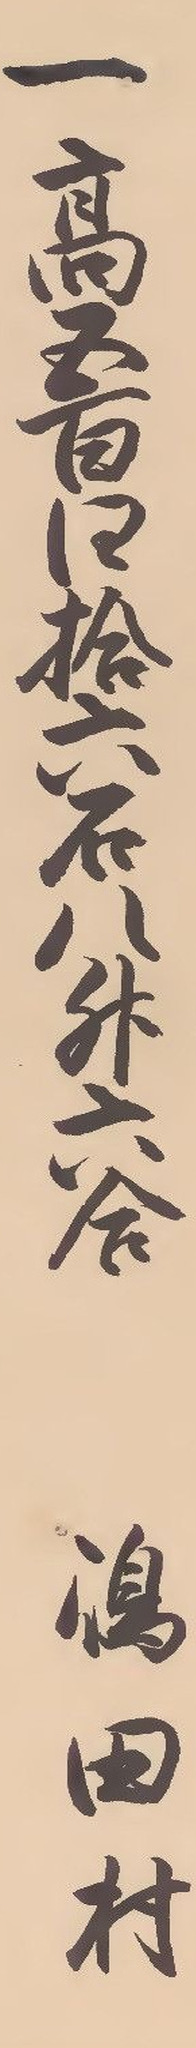一高五百四拾六石八升六合島田村
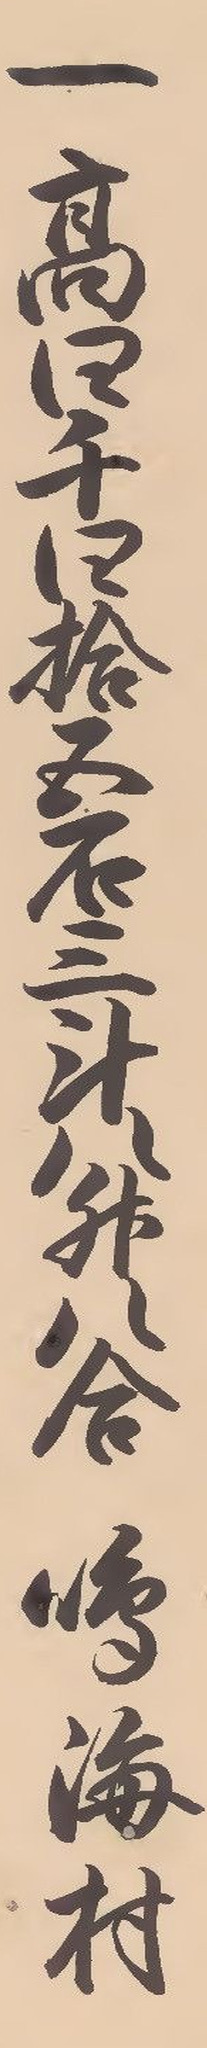一高四千四拾五石三斗八升八合鳴海村
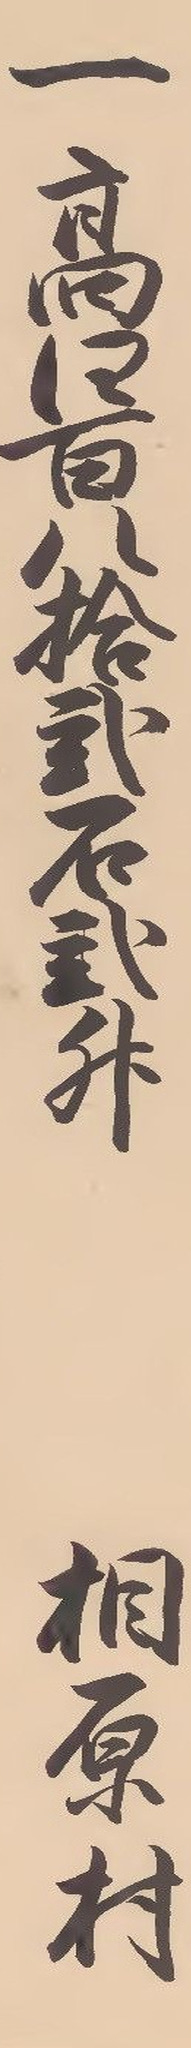一高四百八拾弐石弐升相原村
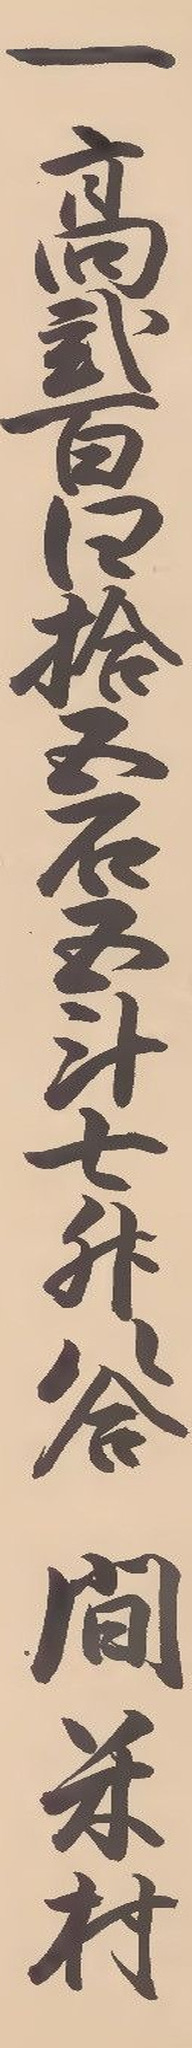一高弐百四拾五石五斗七升八合間米村
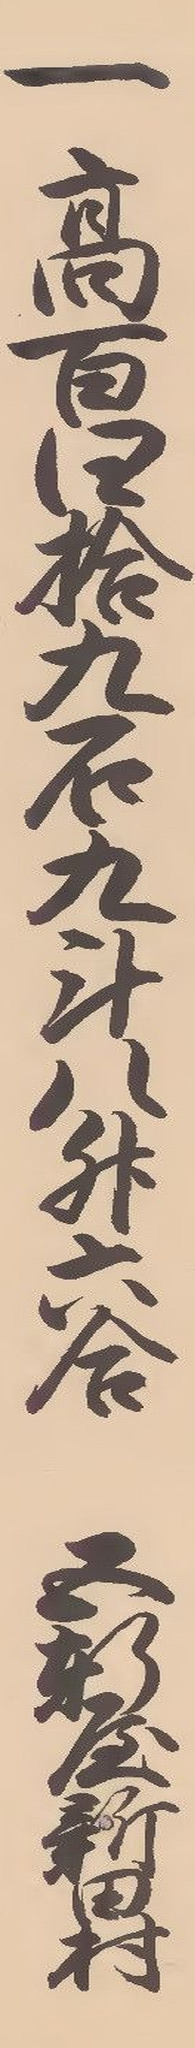一高百四拾九石九斗八升六合五軒屋新田村
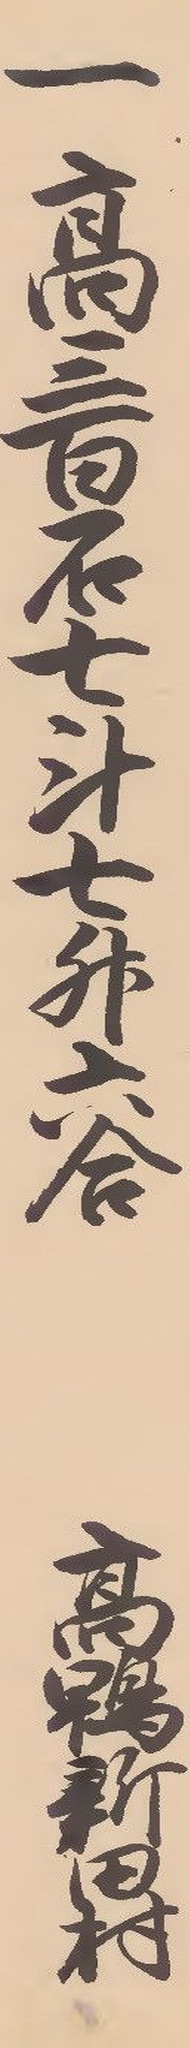一高三百石七斗七升六合高鴨新田村
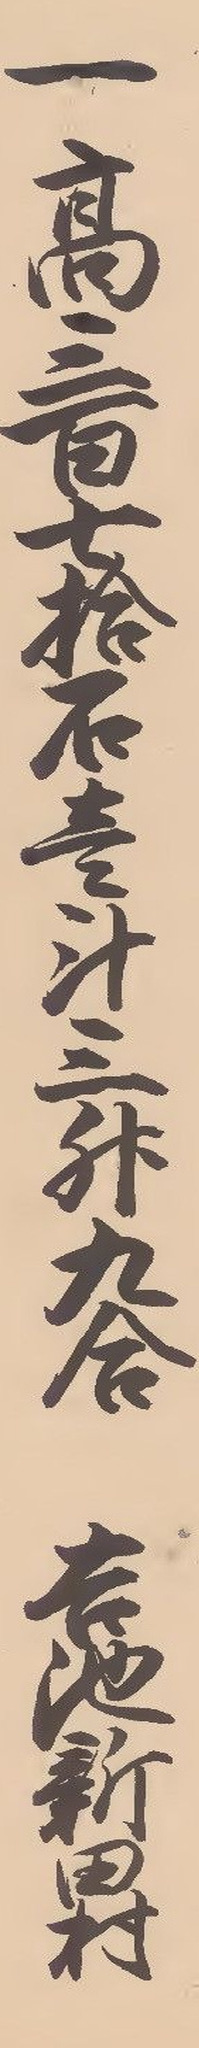一高三百七拾石壱斗三升九合吉池新田村
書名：尾張国郷帳
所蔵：国立公文書館 National Archives of Japan
